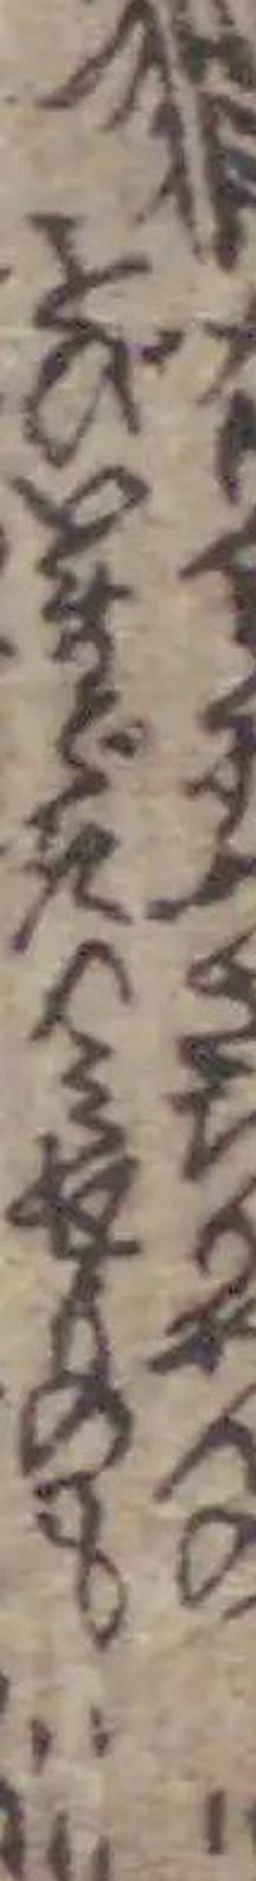をびいまどきはみせものも
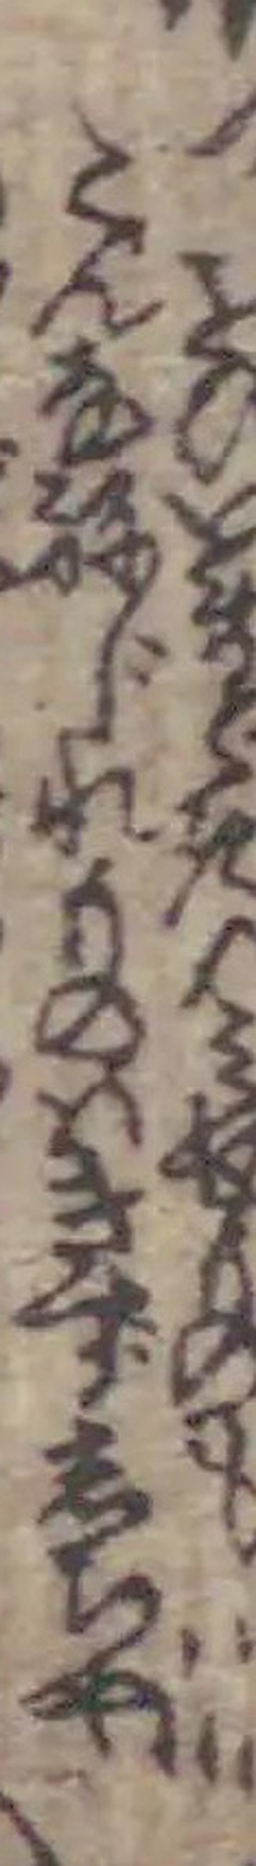こんなねじれものはきずしちや
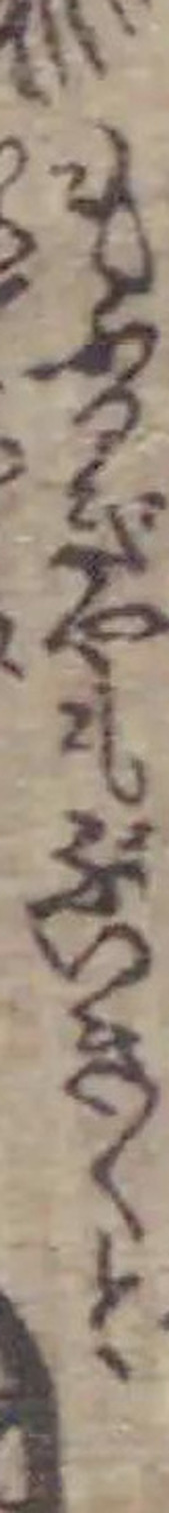もふるぎやもぶいき〳〵と
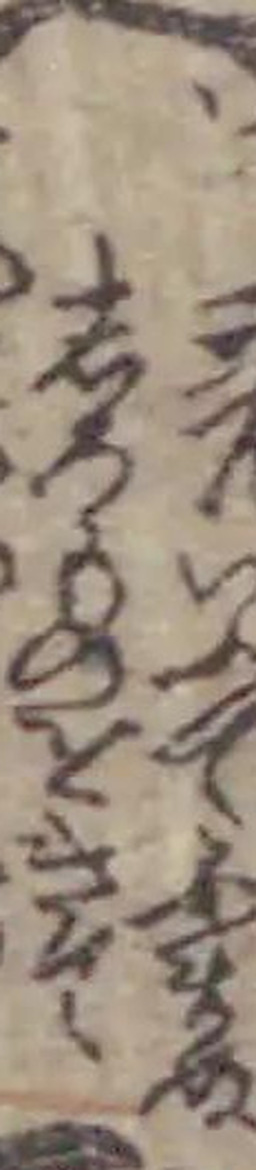しろものをきて
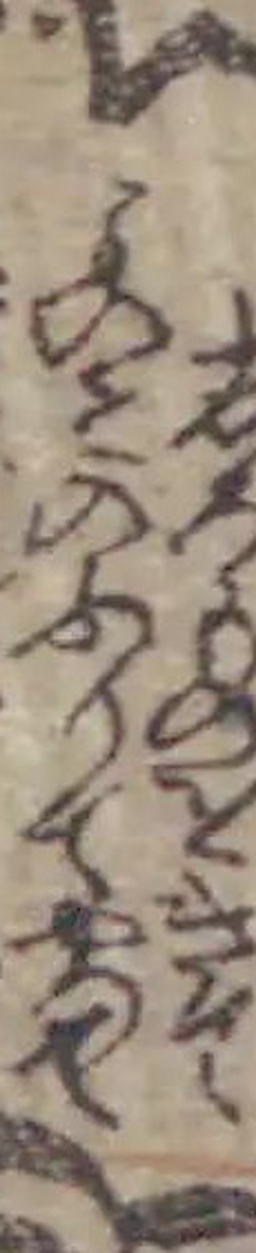まいこのふりてやつて
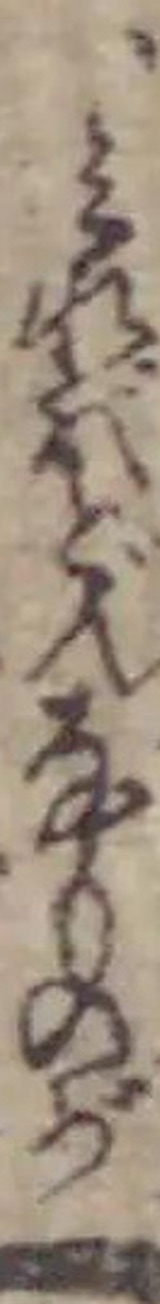みればどんなものが
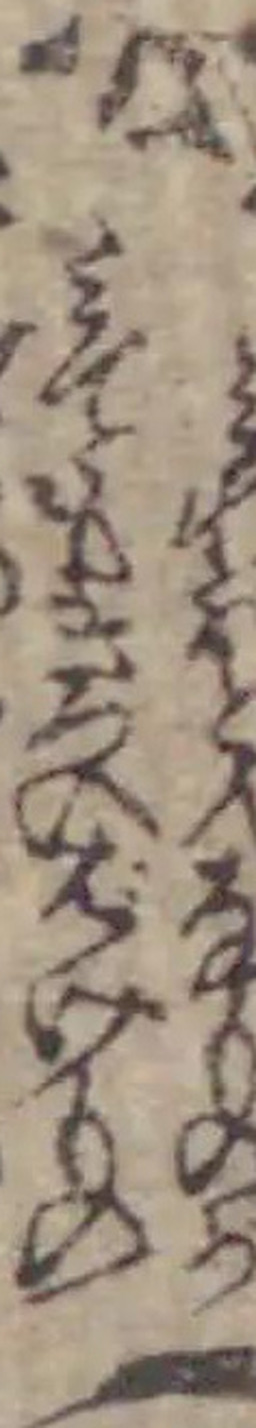みてもきついばけもの
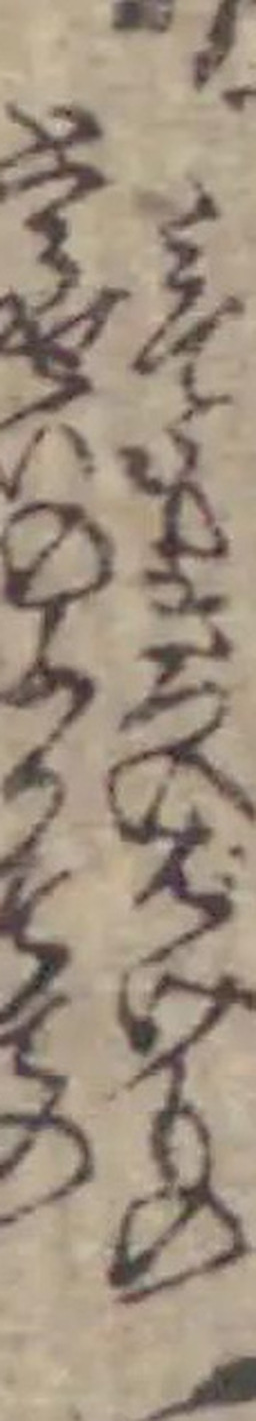とうせいのふりそての
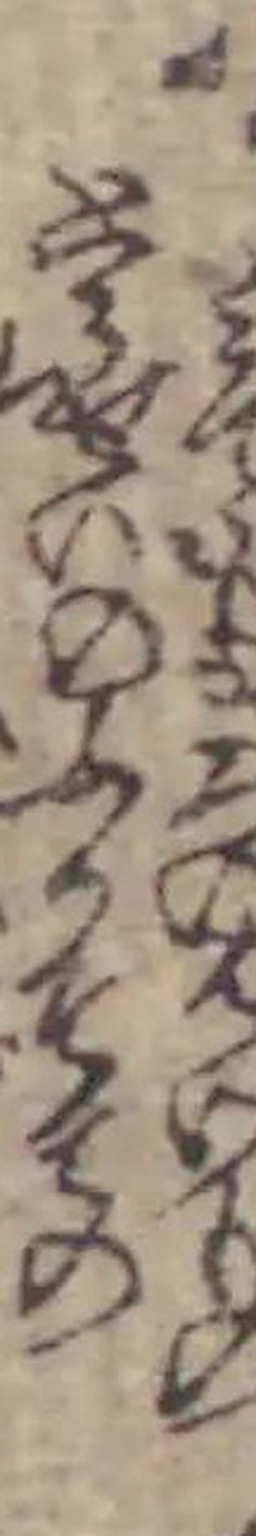とうせいのふりそての
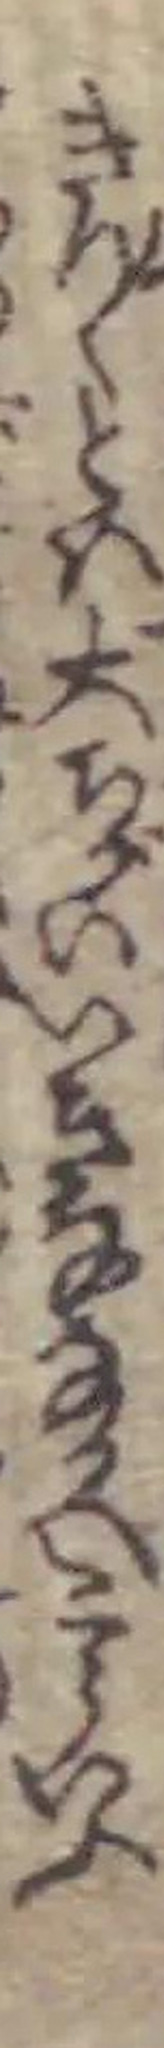きん〳〵とは大ちがいいきななかへこういふ
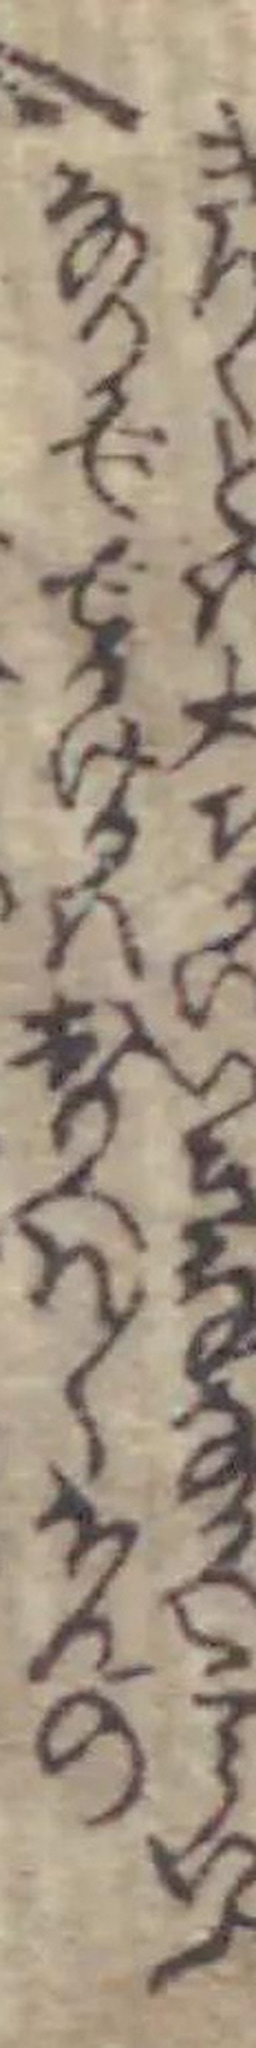なりででかけるはおもへは〳〵ほんの
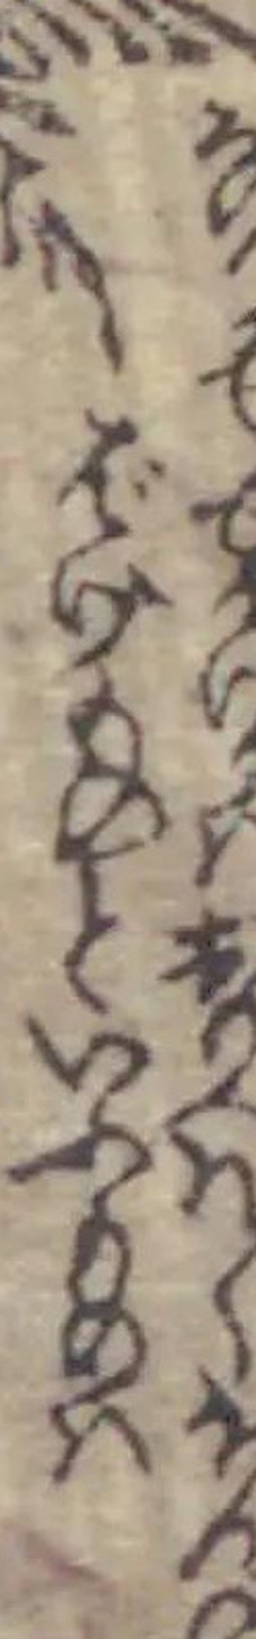ばけものといふものは
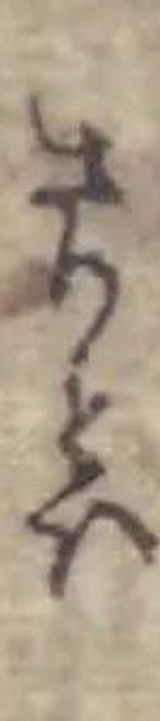さりとは
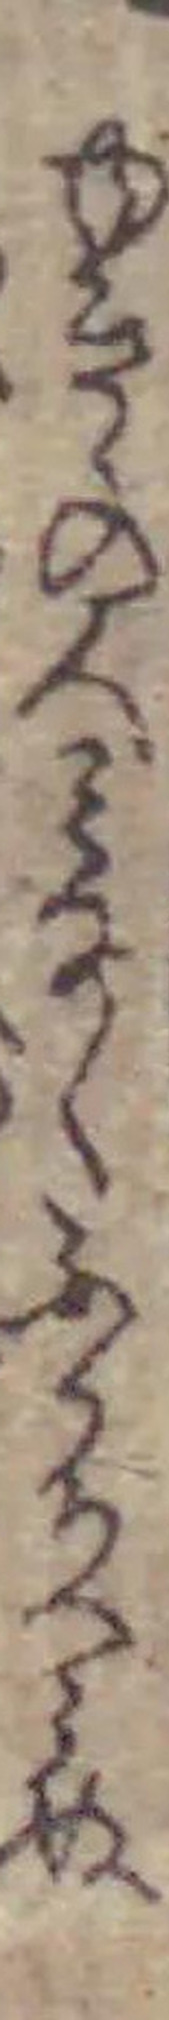ゆきゝの人みな〳〵ふりかへらぬ
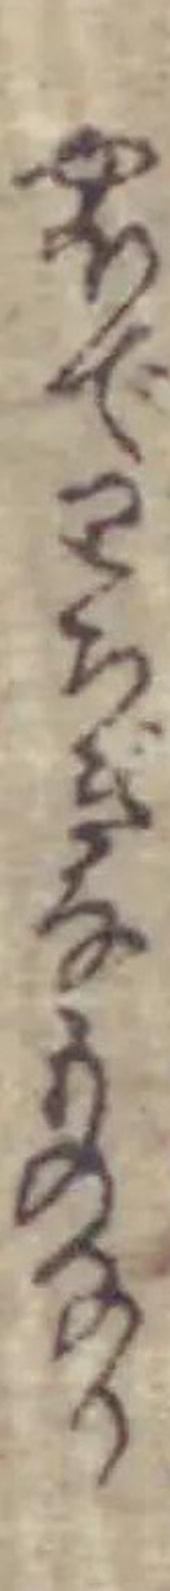やほでりちぎなものなり
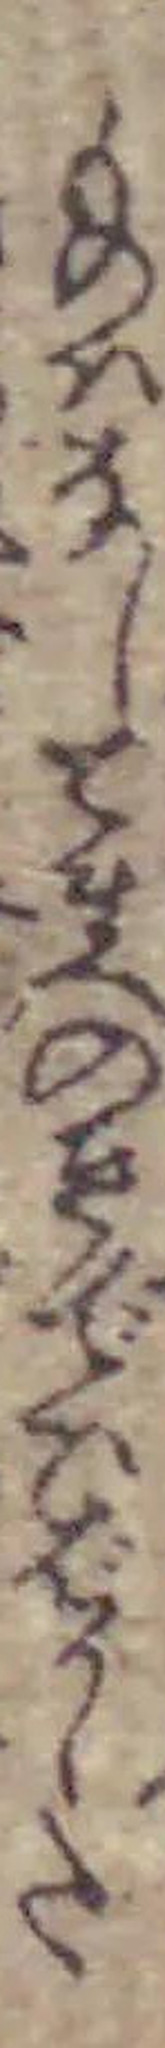ものはなしてまへのきではばかした
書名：化物昼寝鼾 2巻
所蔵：国立国会図書館 National Diet Library, JAPAN
